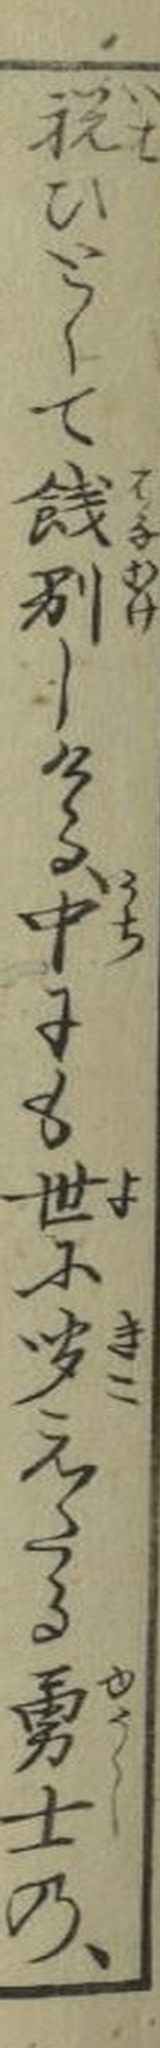祝ひとして餞別しける、中にも世に聞えたる勇士の、
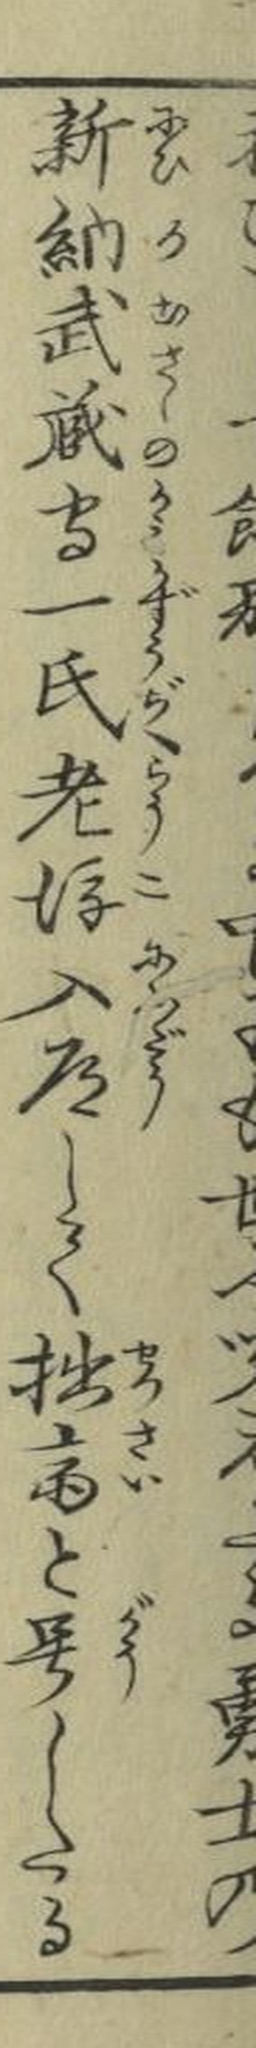新納武蔵守一氏、老後入道して拙斉と号したる
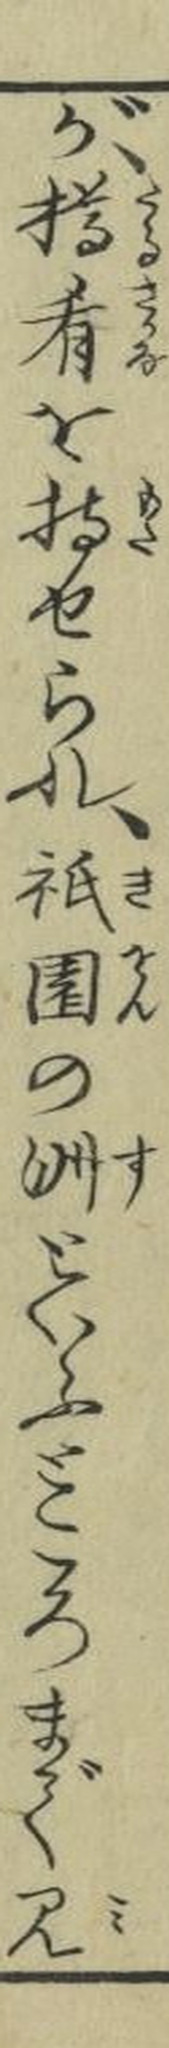が、樽肴を持せられ、祇園の洲といふところまで見
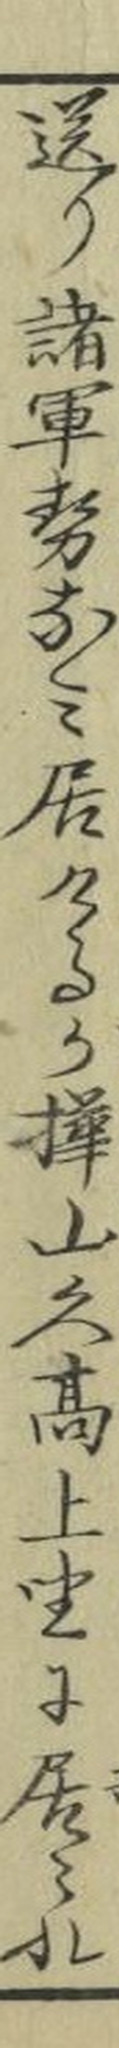送り、諸軍勢なみ居けるが、樺山久高上坐に居られ
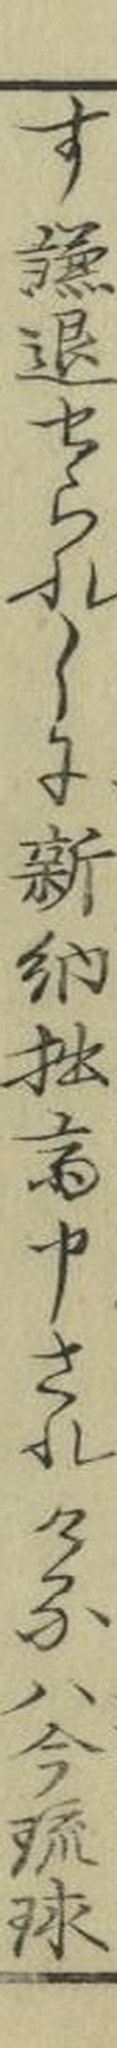ず謙退せられしに、新納拙斉申されけるは、今琉球
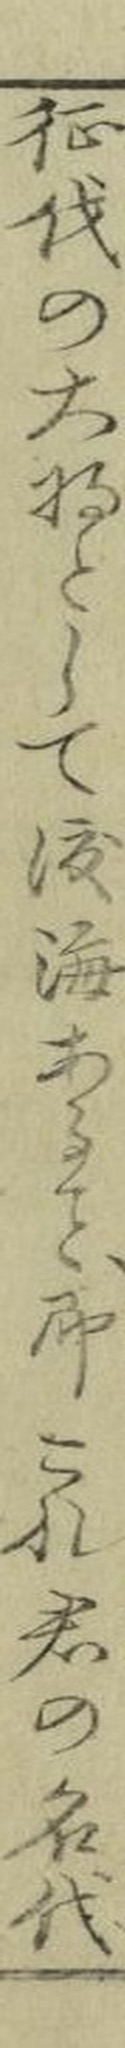征伐の大将として渡海あること、即これ君の名代
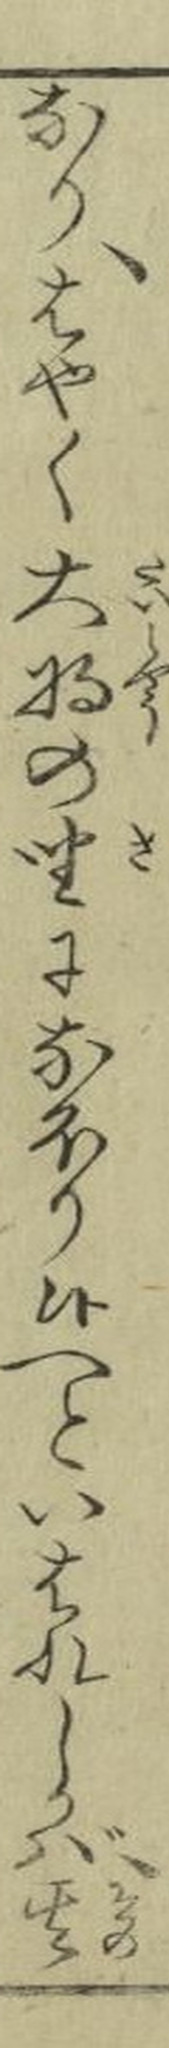なり、はやく大将の坐になほり候へといはれしかば、其
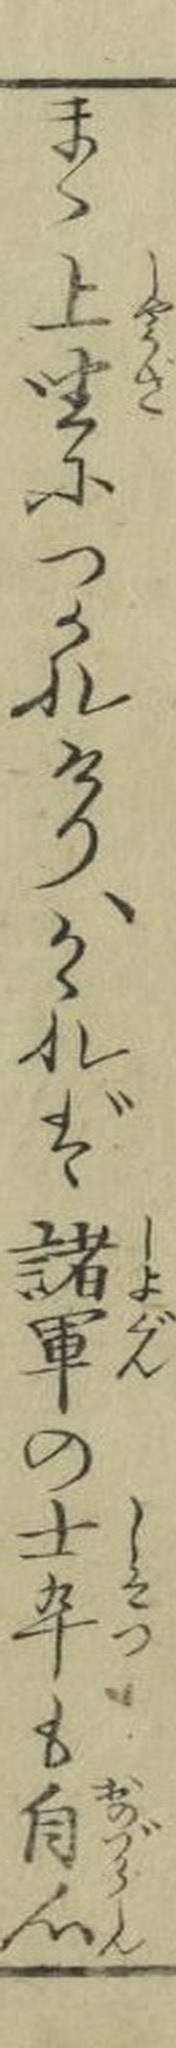まゝ上坐につかれけり、かゝれば諸軍の士卒も自心
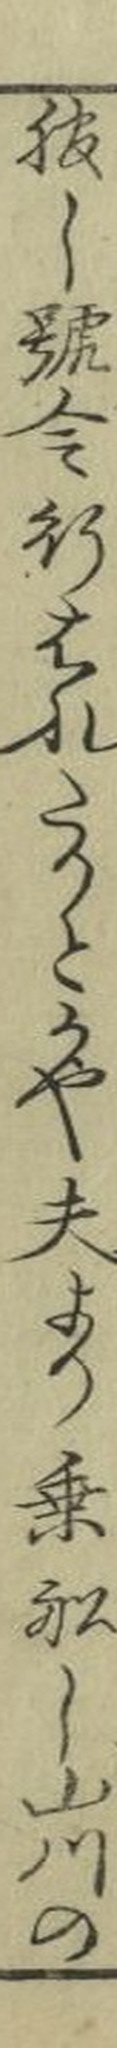服し、号令行はれたりとかや、夫より乗船し、山川の

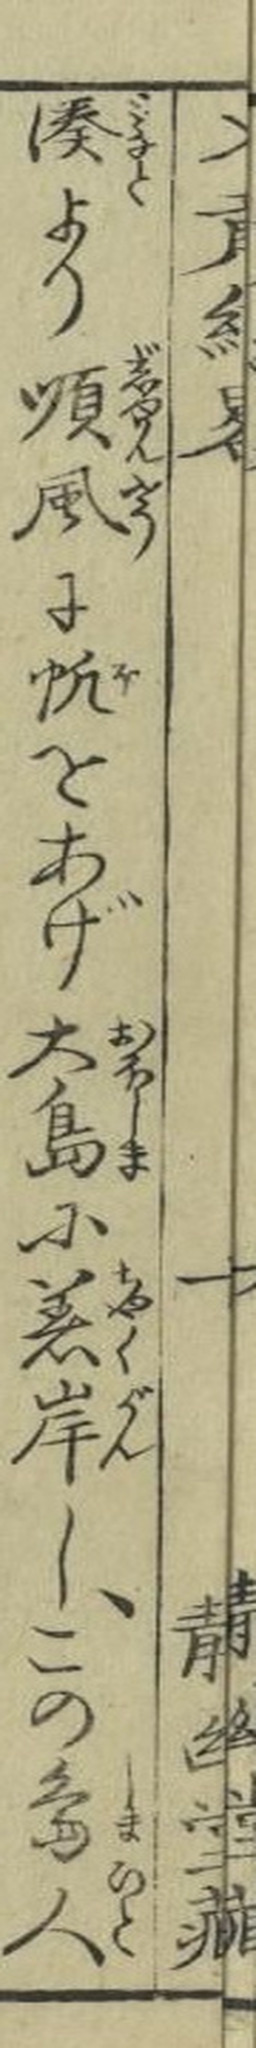湊より順風に帆をあげ大島に着岸し、この島人
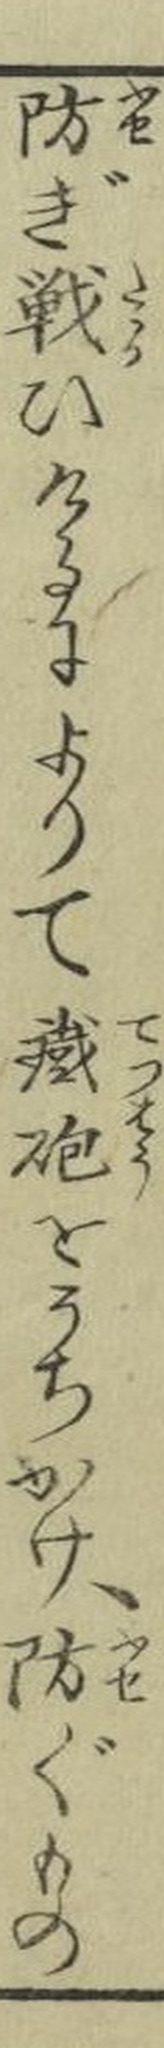防ぎ戦ひけるによりて鉄砲をうちかけ、防ぐもの
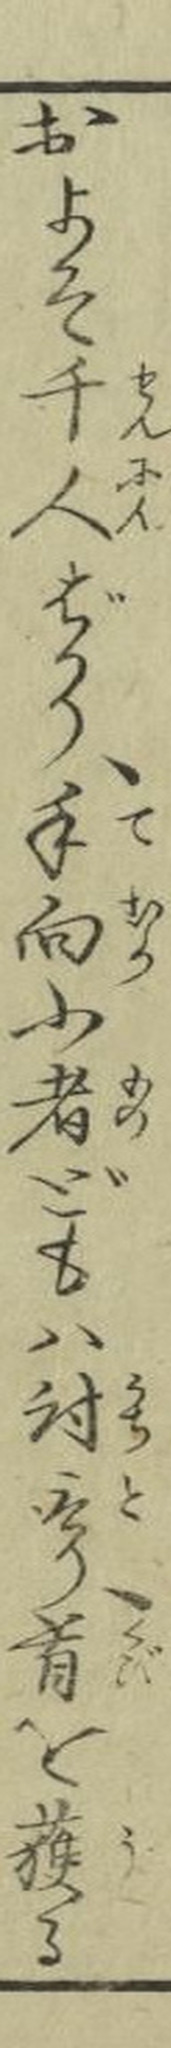およそ千人ばかり、手向ふ者どもは討取り、首を獲る
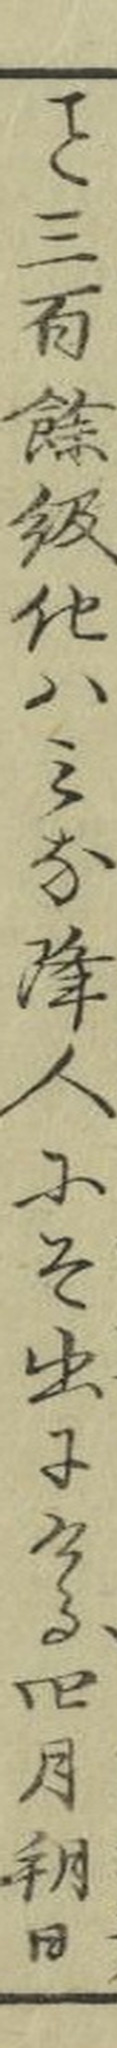こと三百余級、他はみな降人にぞ出にける、四月朔日
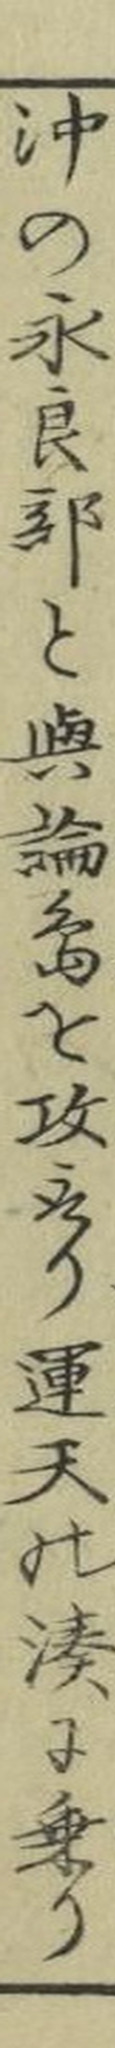沖の永良部と与論島を攻取り、運天の湊に乗り
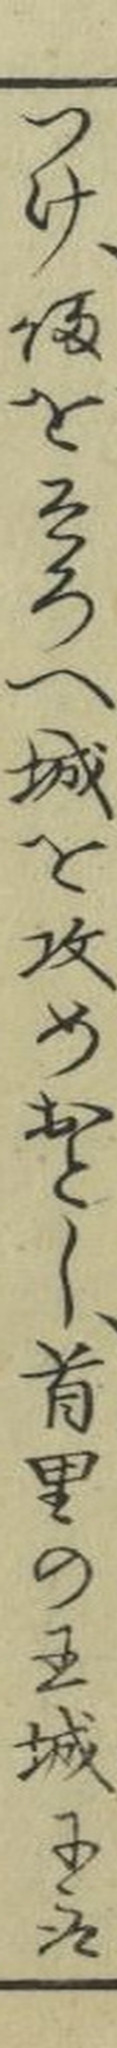つけ、備をそろへ城を攻めおとし、首里の王城に取
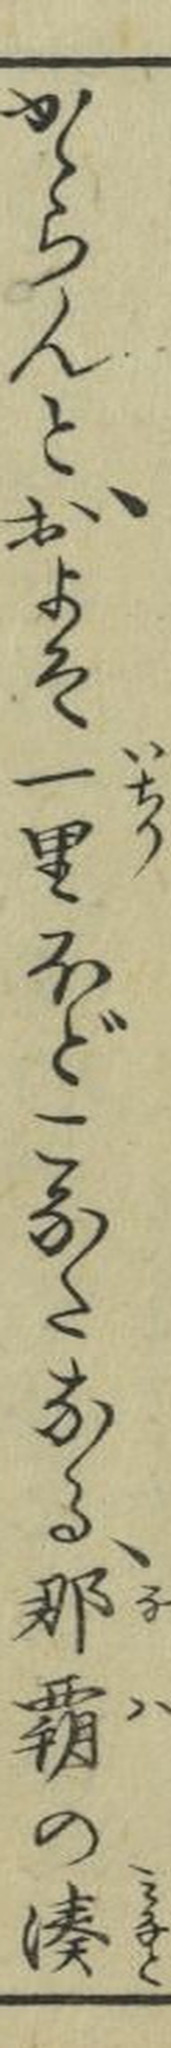かゝらんと、およそい一里ほどこなたなる、那覇の湊
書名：琉球入貢紀略
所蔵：University of the Ryukyus Library
